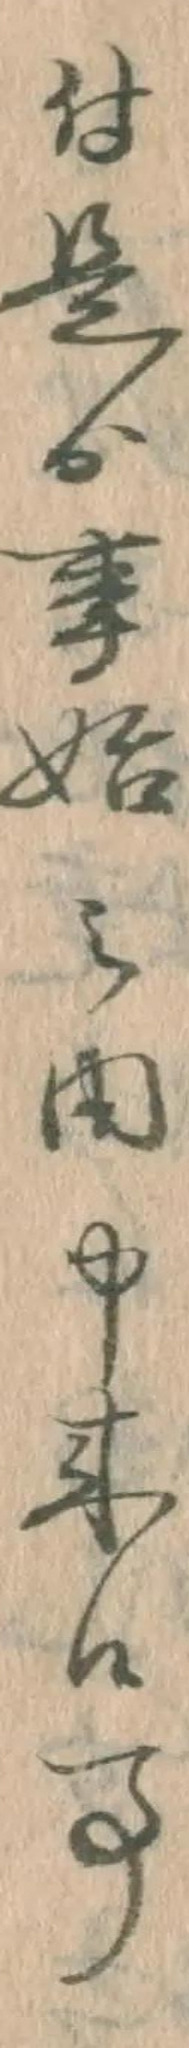付是ゟ事始之由申来候事
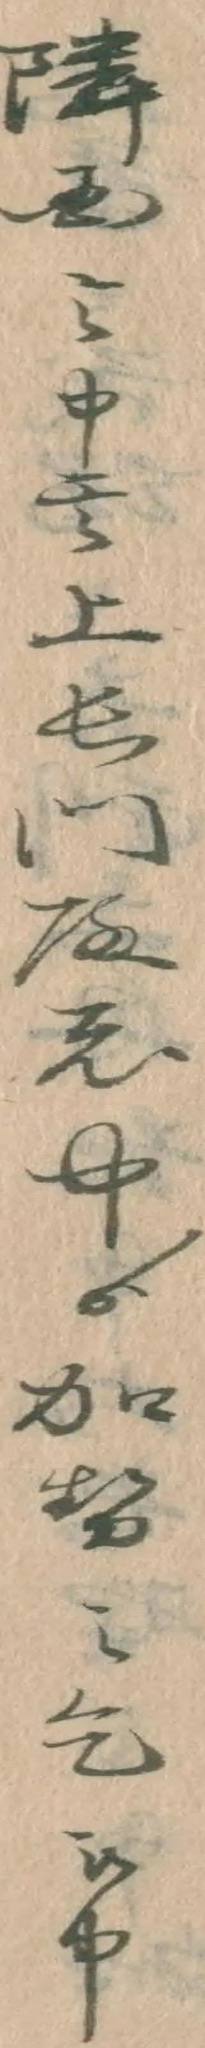一隣国之申其上長門殿老中ゟ加勢之乞被申
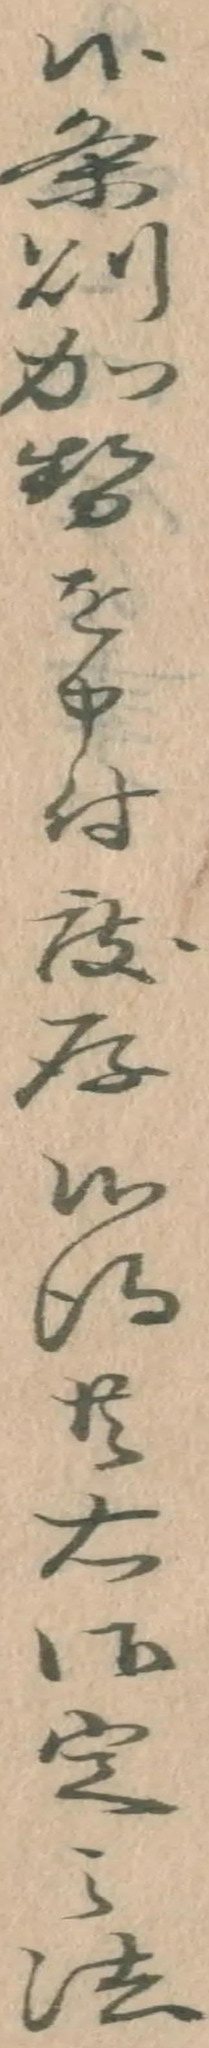候条則加勢を申付度存候得共右御定之法
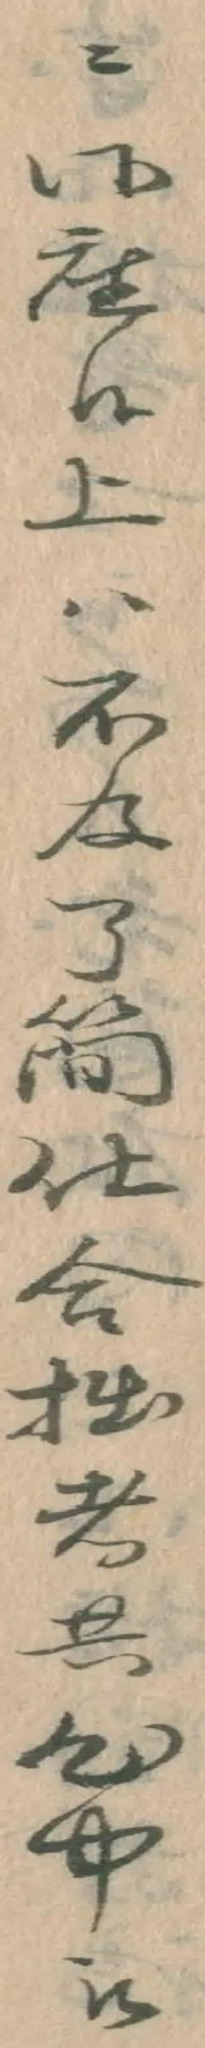に御座候上は不及了簡仕合拙者共心中被

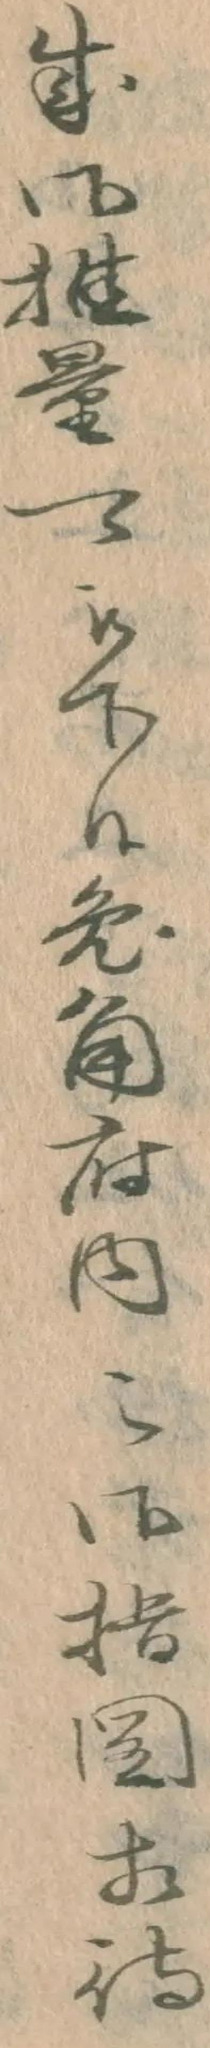成御推量可被下候兎角府内之御指図相待
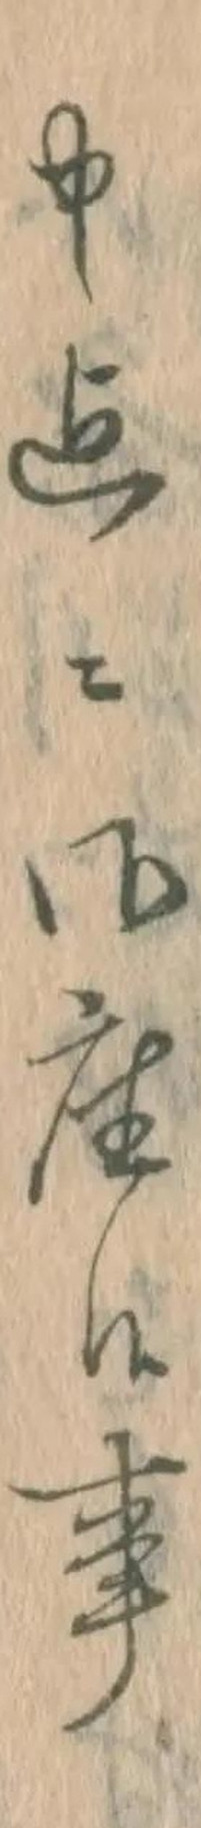申迄に御座候事
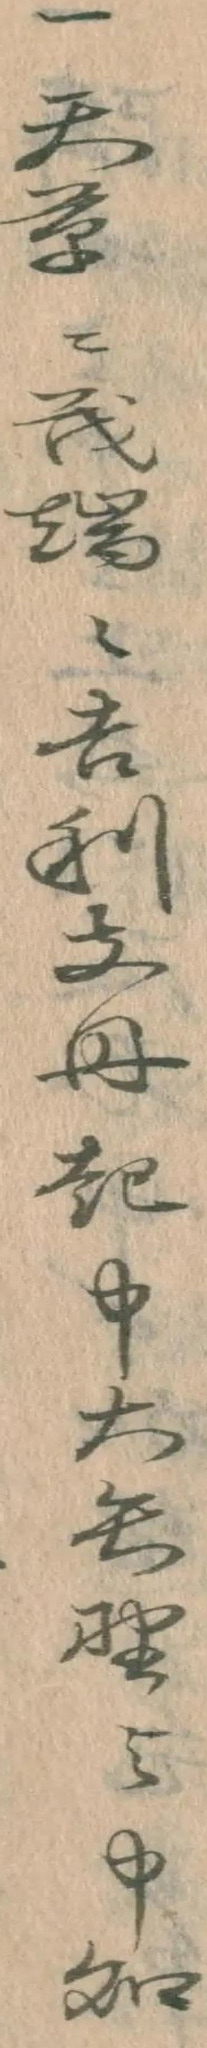一天草に茂端々吉利支丹起申大矢野与申処
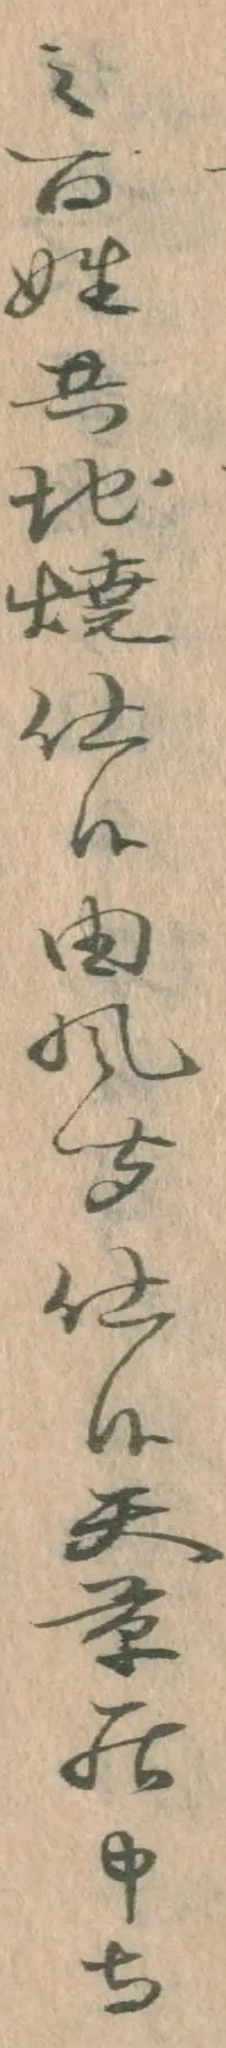之百姓共地焼仕候由風聞仕候天草居申寺
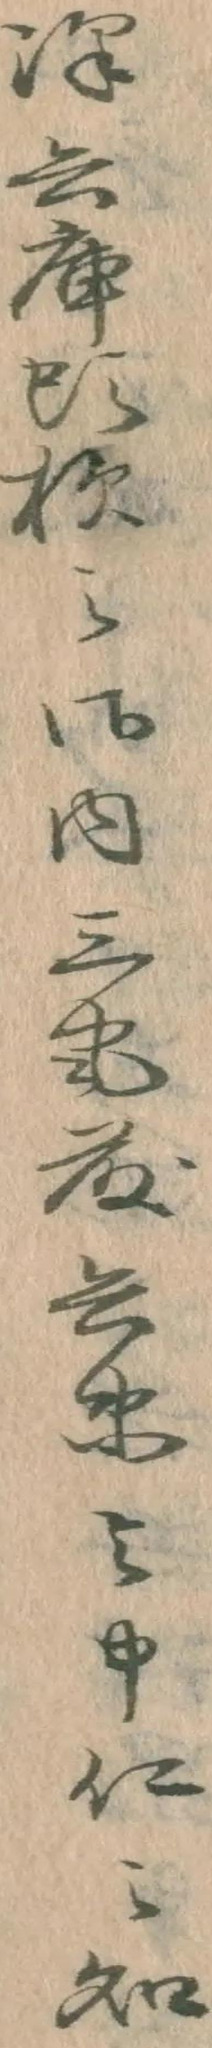沢兵庫頭様之御内三宅藤兵衛与申仁之処
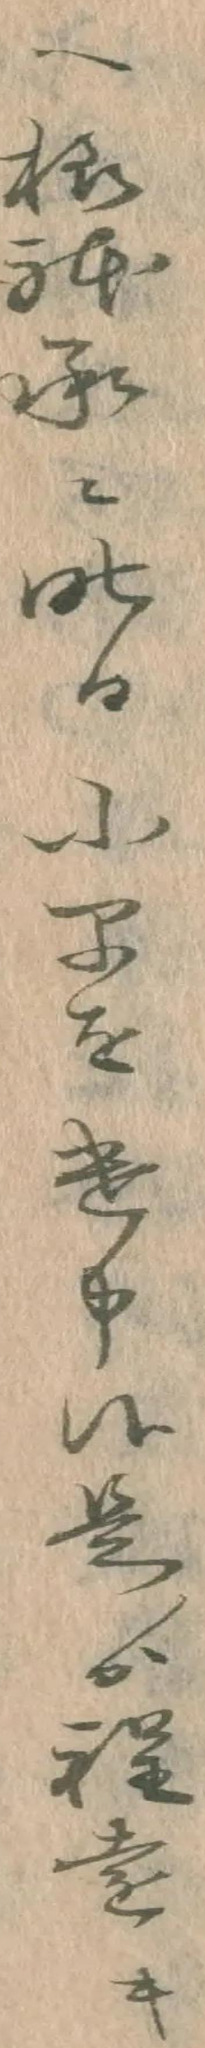へ様躰承に昨日小早を遣申候是ゟ程遠き
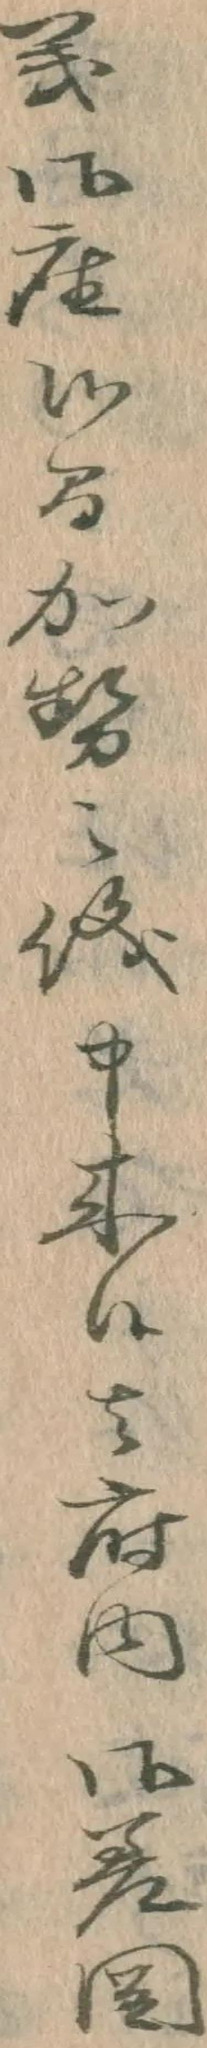義御座候間加勢之儀申来候者府内御差図
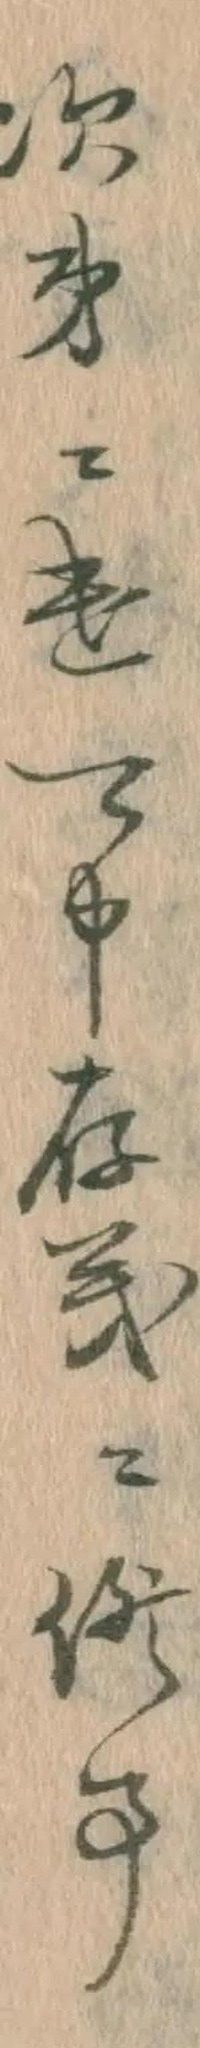次第に遣可申存義に候事
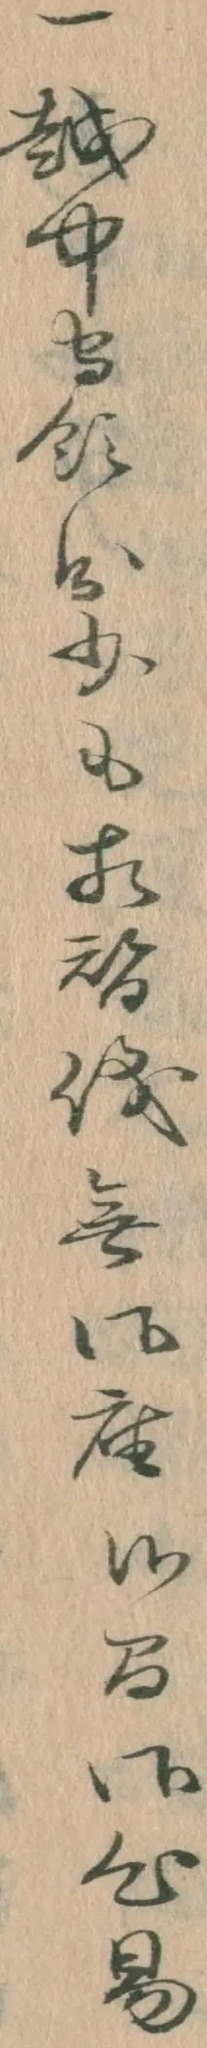一越中守領分少も相替儀無御座候間御心易
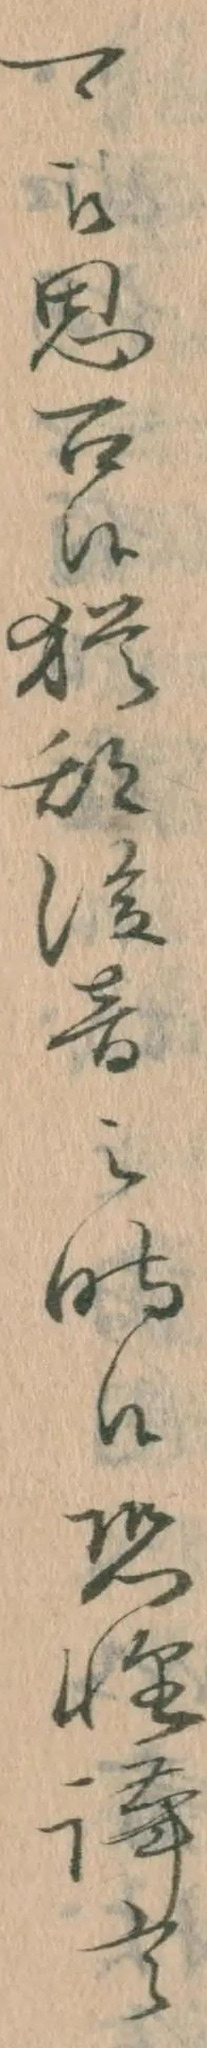て被思召候猶斯後音之時候恐惶謹言
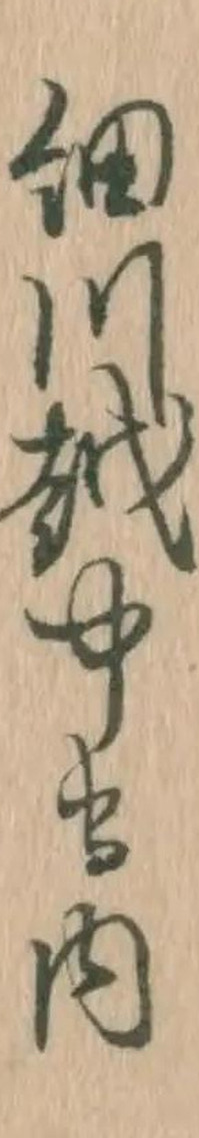細川越中守内
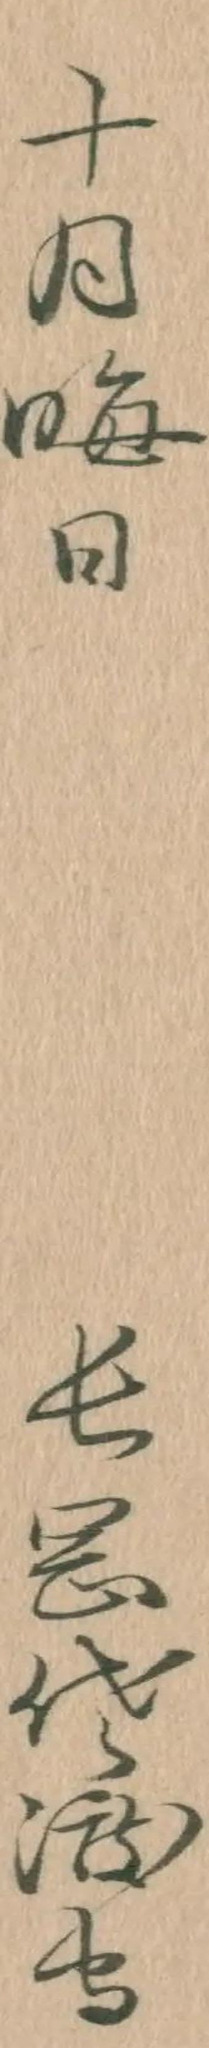十月晦日長岡佐渡守
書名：切支丹御退治記 49巻. [2]
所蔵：国立国会図書館 National Diet Library, JAPAN
